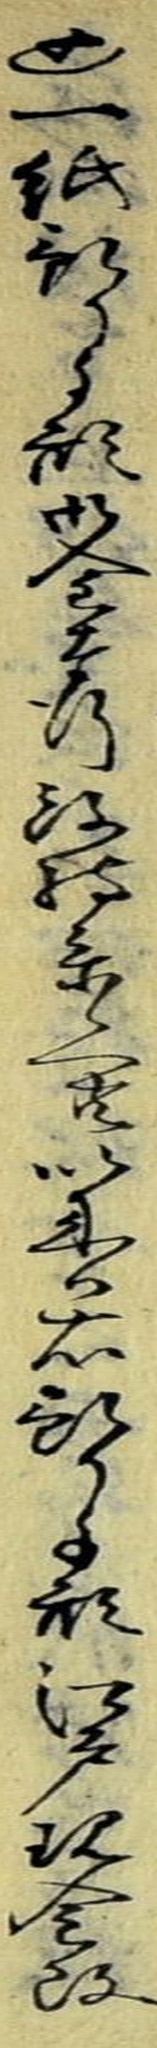込一紙預手形御金奉行致持参候へ共以来は右預手形江戸現金改

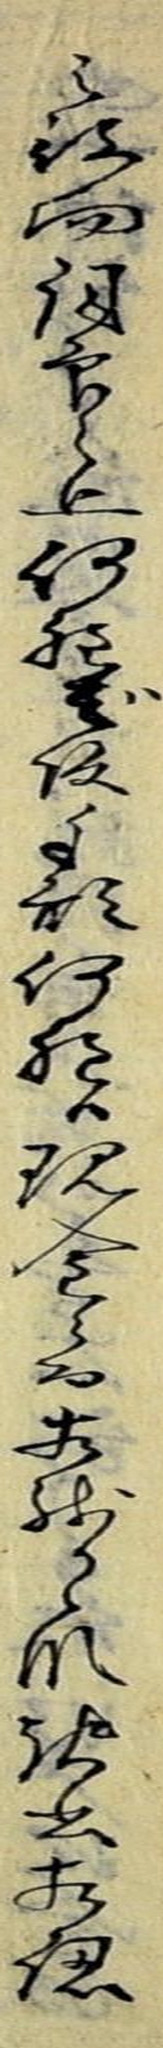之役向調印之上何程は仮手形何程は現金にて相残候段訳書相認
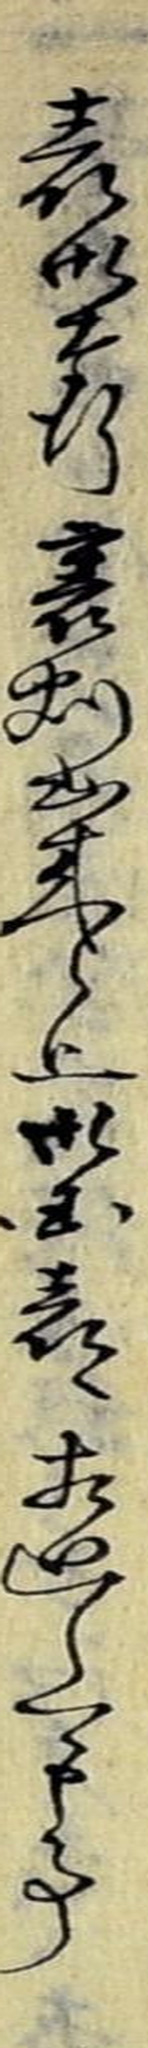表御奉行裏判出来候上御国表へ相廻可申事
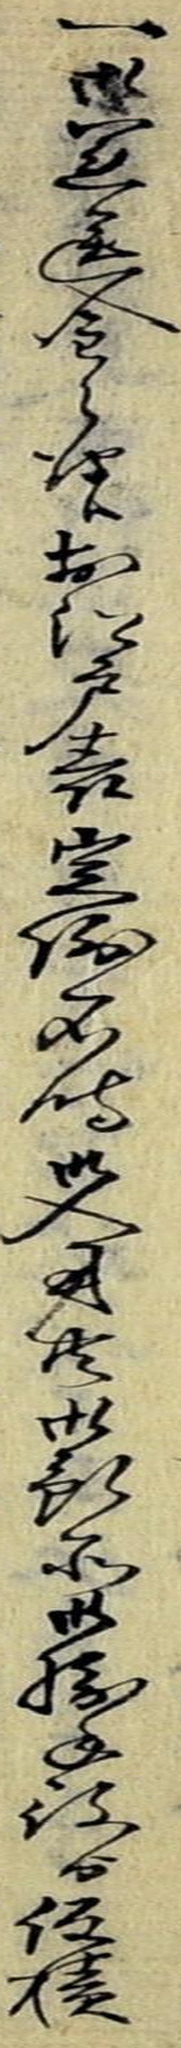一御運送金之儀は於江戸表定例不時御入用共御預所御勝手役ゟ仮積
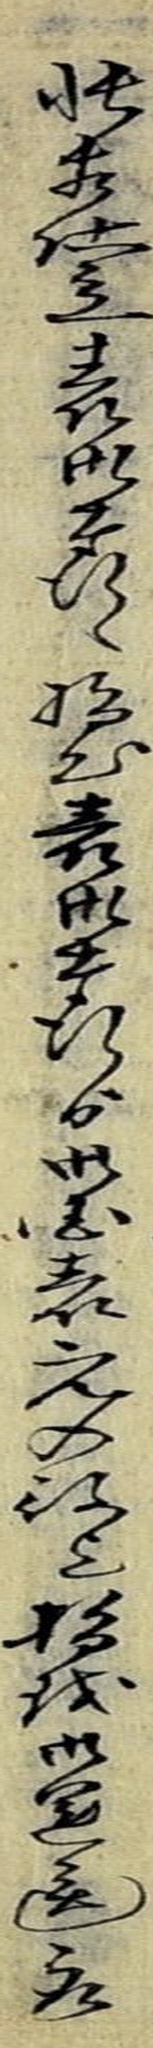帳相仕立表御奉行へ指出表御奉行ゟ御国表元〆役迄指越御運送取
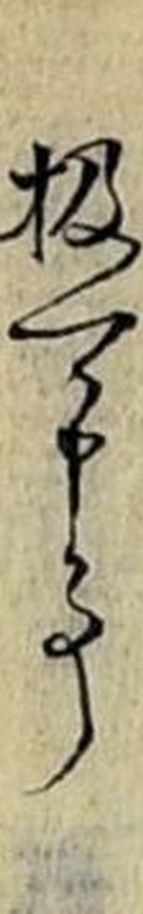扱可申事
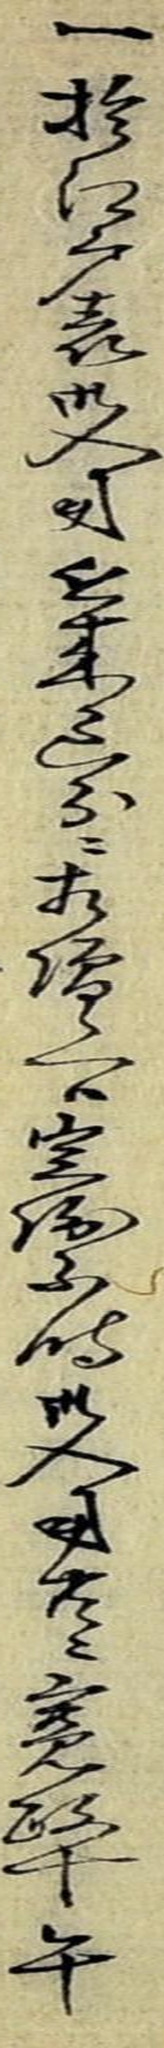一於江戸表御入用近来過分に相増候へは定例不時御入用共に寛政十午
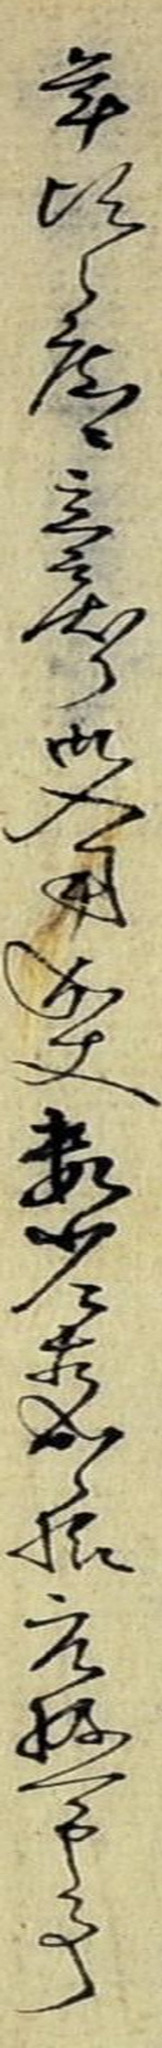年頃之度に立戻り御入用成丈数少に相成候様取扱可申事
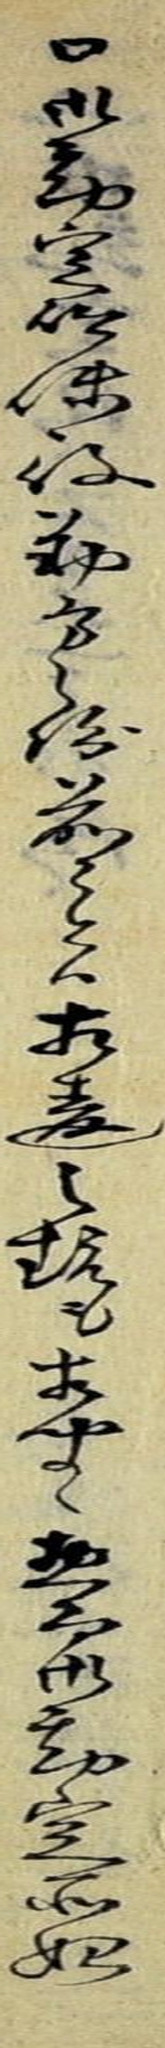○御勘定吟味役勤方之儀前々とは相違之趣も相聞候惣而御勘定所始
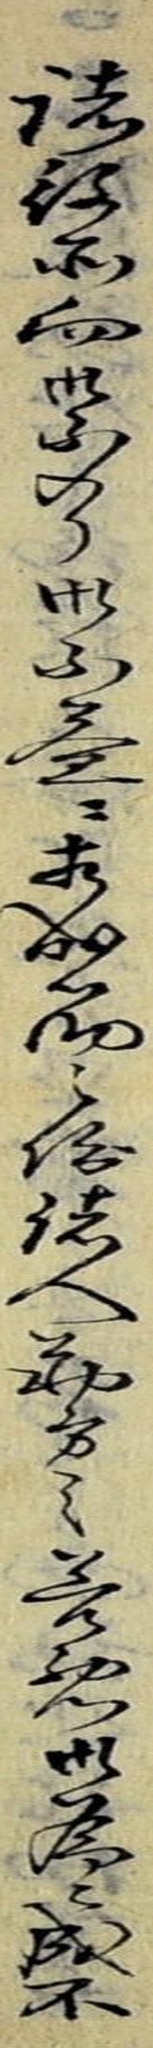諸役所向御不〆り御不益に相成筋之儀諸人勤方之善悪御為に成不
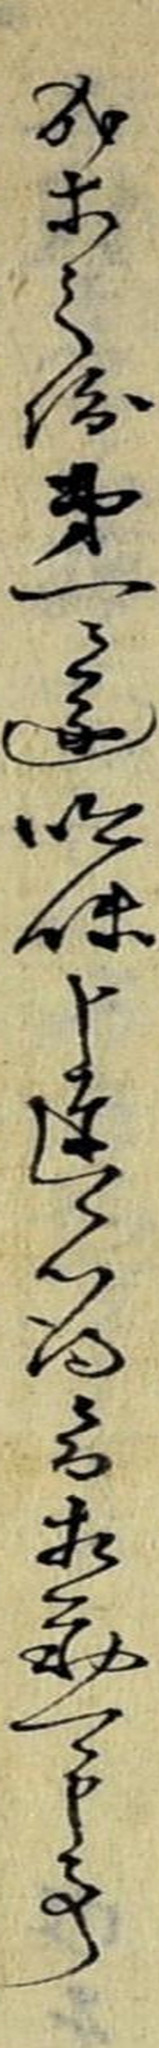成等之儀第一に遂吟味申達候心得に而相勤可申事
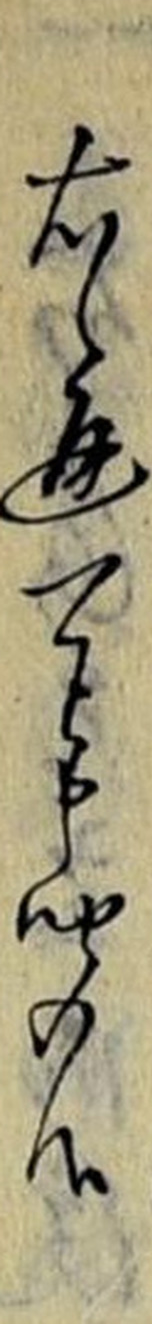右之通可被申聞候
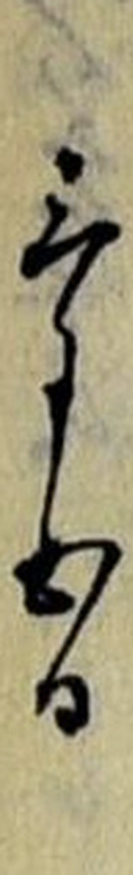三月五日
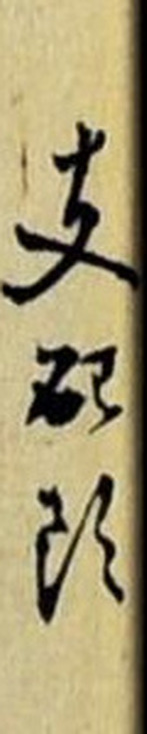支配頭
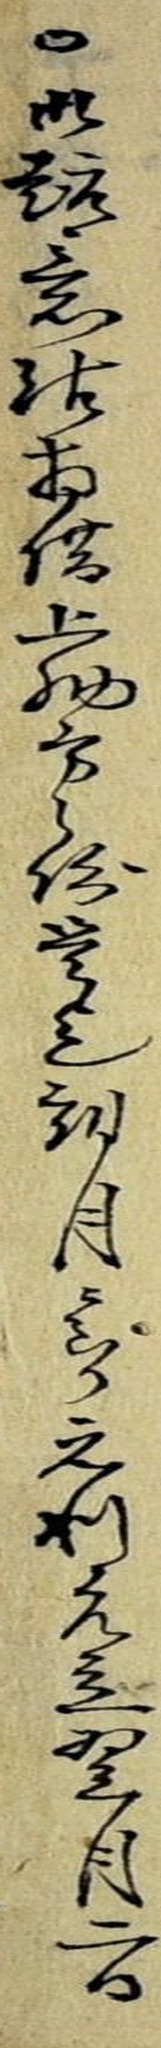○御趣意銀拝借上納方之儀是迄朔月に至り元利取立翌月二日
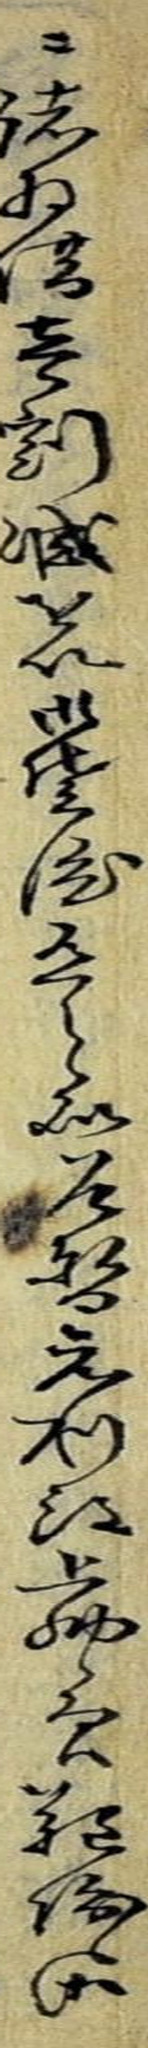に諸拝借壱割減を以御貸渡有之候処取替元利致上納候而は難儀之趣
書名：命令之部 四
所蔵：福井県文書館 Fukui Prefectural Archives
